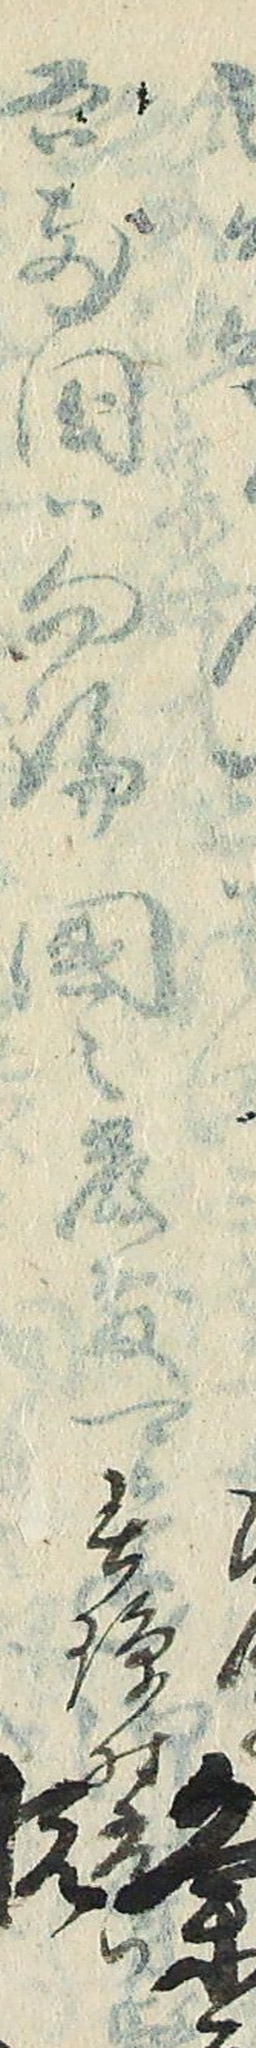矢野村右同
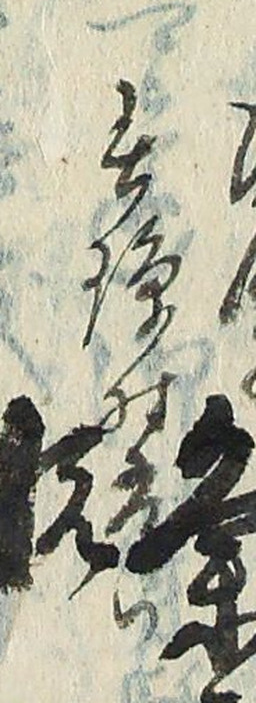府中村庄屋
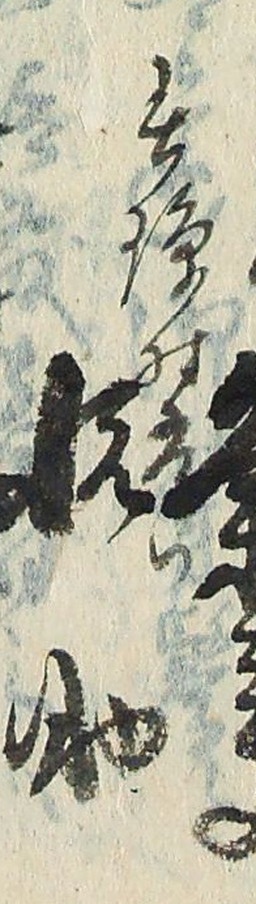矢野村右同
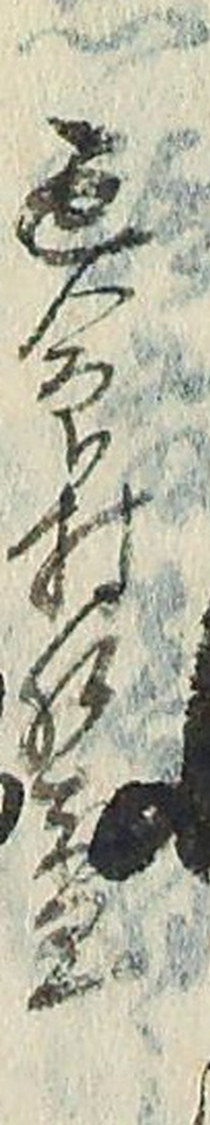延命村肝煎
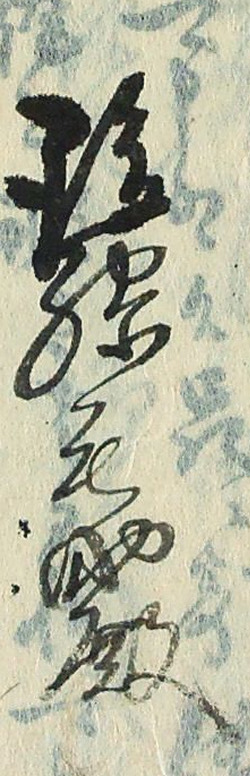後藤庄助殿
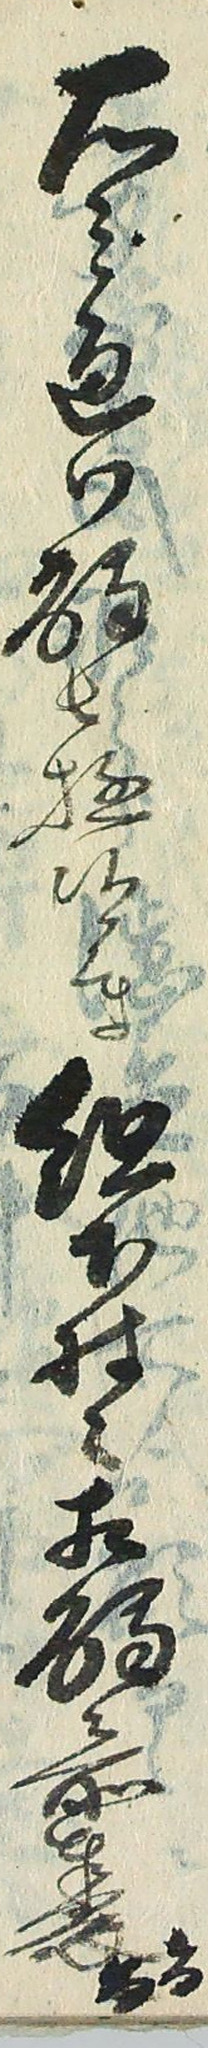右之通御触被遊候に付組下村々相触候所奉畏旨
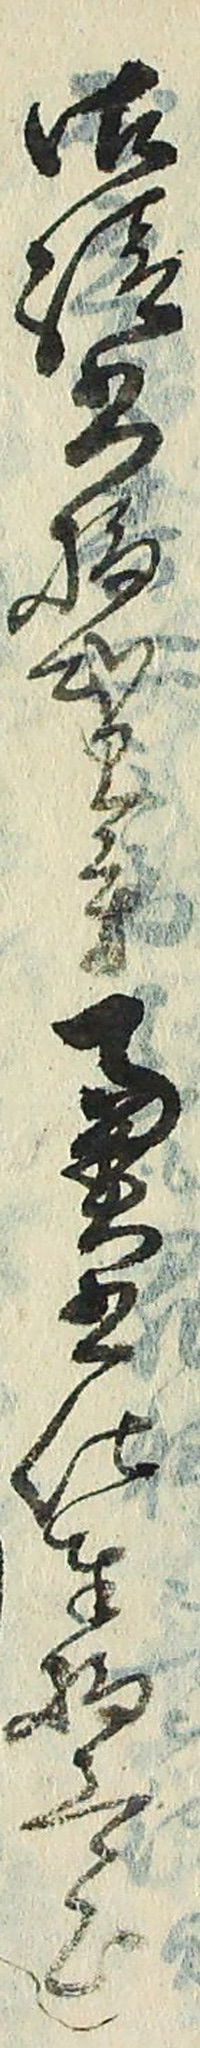御請書指出申候に付奥書仕奉指上候以上
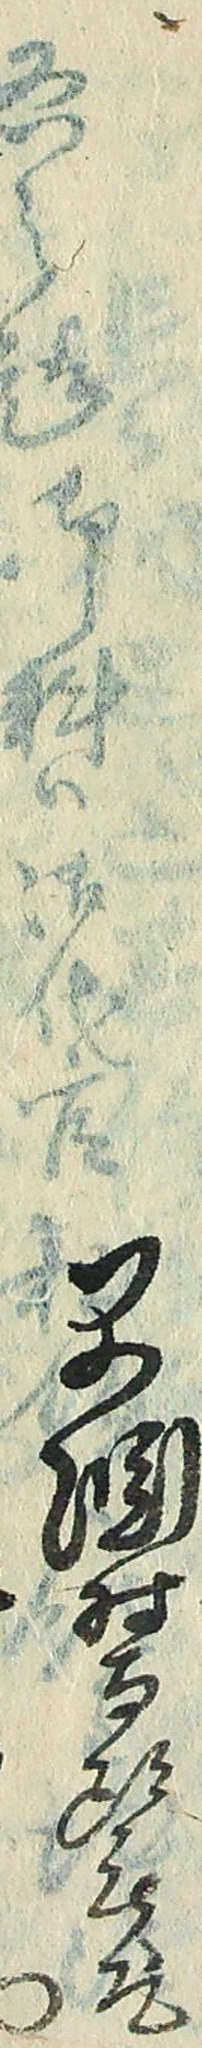早淵村与頭庄屋
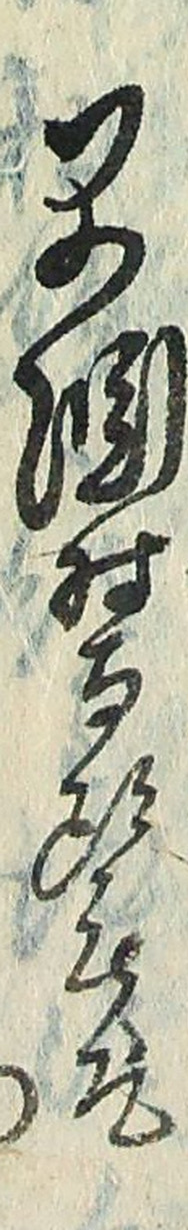早淵村与頭庄屋
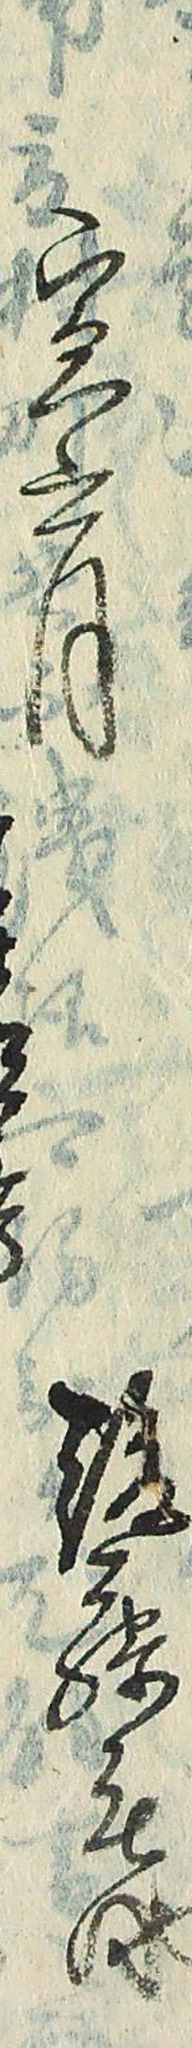寅六月後藤庄助
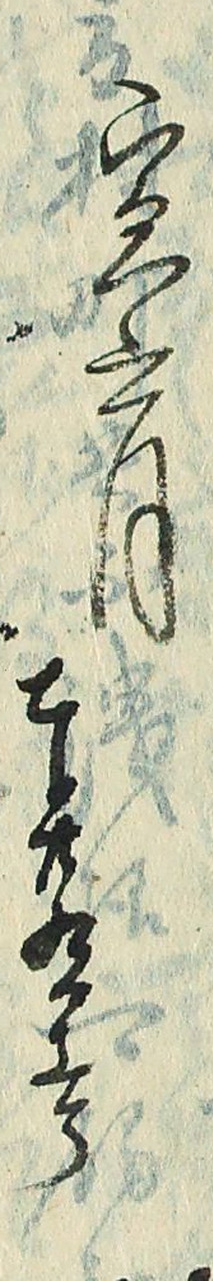七月廿九日上ケ
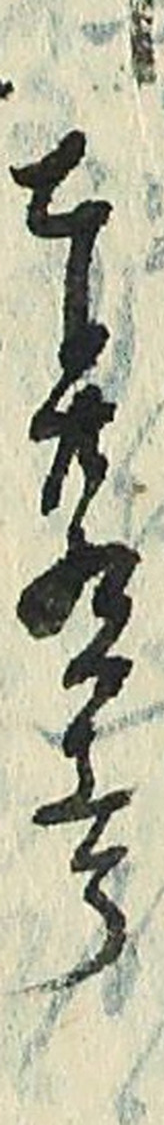七月廿九日上ケ
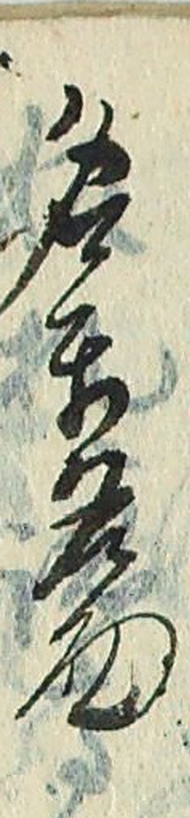名東名西
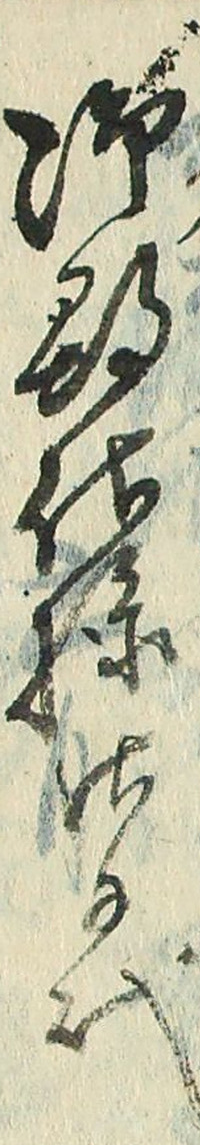御郡代様御手代
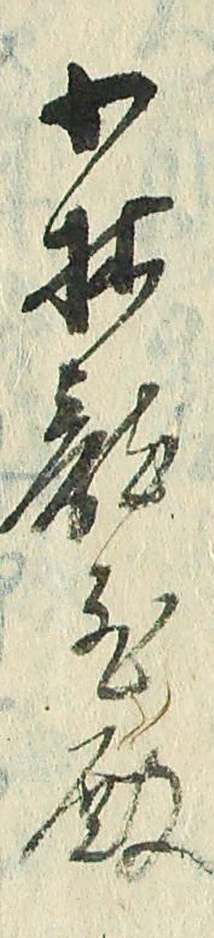小林龍蔵殿
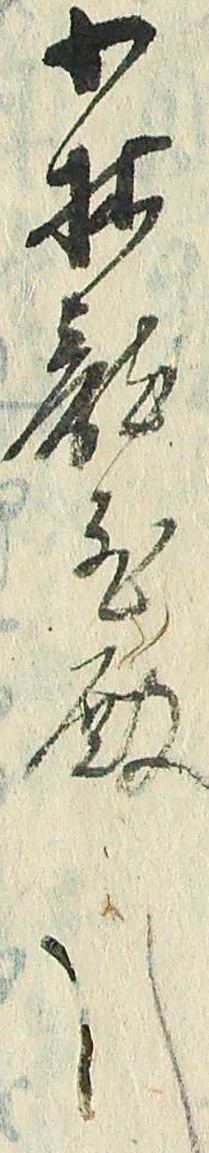小林龍蔵殿
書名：諸御用御□受書控
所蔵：鳴門教育大学 Naruto University of Education
